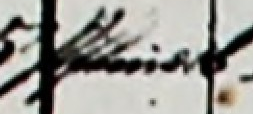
Pflindsb.
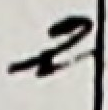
2
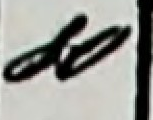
80
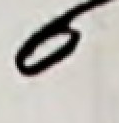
6
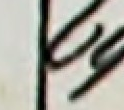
69
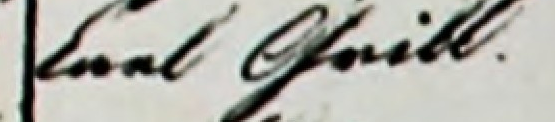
Carl Chribl.
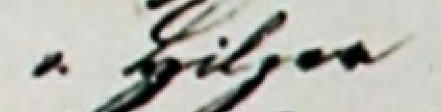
v. Hilger
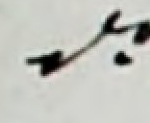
do
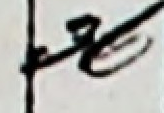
36
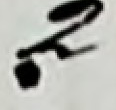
2
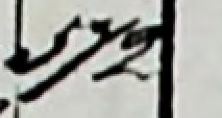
572
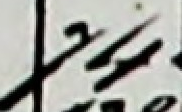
74
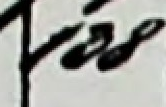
138
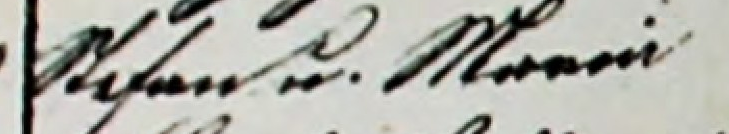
Stefan u. Maria
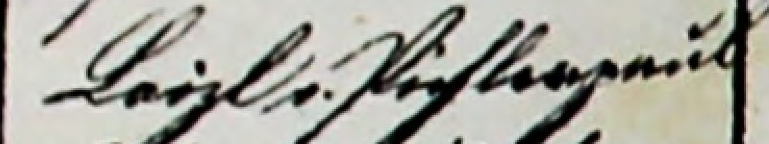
Loizl v. Pichlerpaul
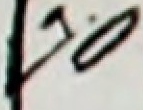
70
